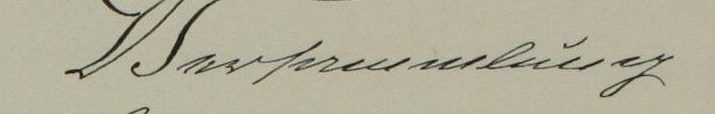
Versammlung
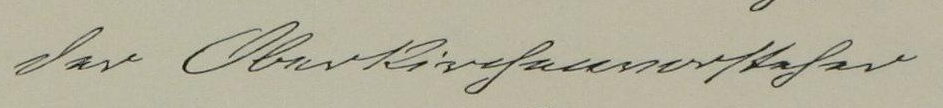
der Oberkirchenvorsteher
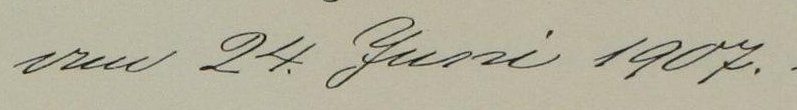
am 24. Juni 1907.
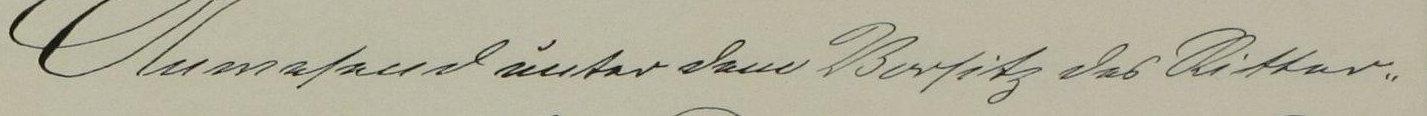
Anwesend unter dem Vorsitz des Ritter-
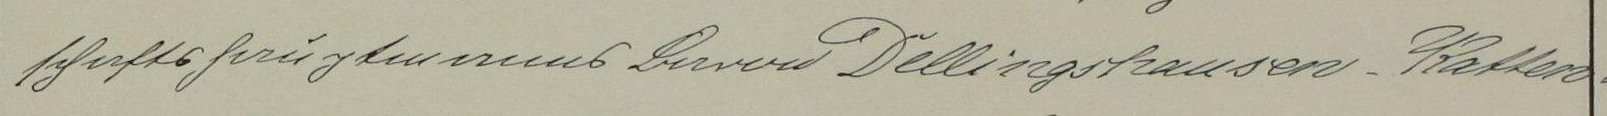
schaftshauptmanns Baron Dellingshausen-Katten-
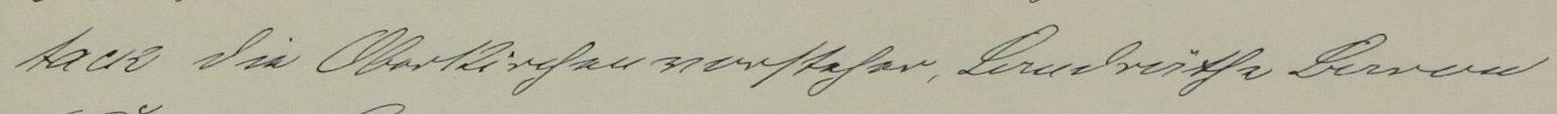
tack die Oberkirchenvorsteher, Landräthe Baron
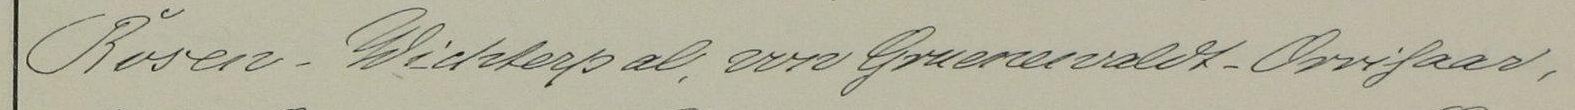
Rosen-Wichterpal, von Gruenewaldt-Orrisaar,
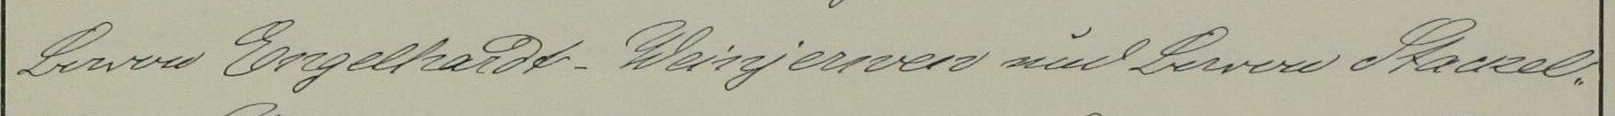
Baron Engelhardt-Weinjerwen und Baron Stackel-
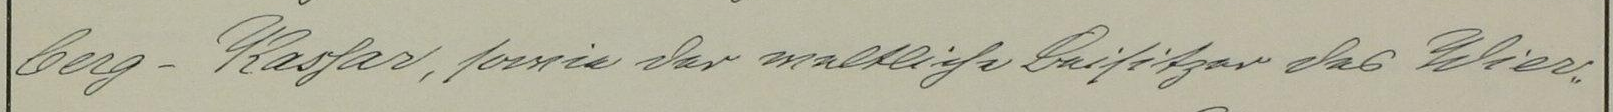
berg-Kassar sowie der weltliche Beisitzer des Wier-
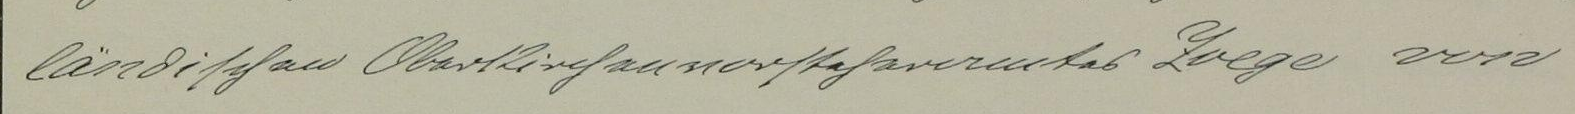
ländischen Oberkirchenvorsteheramtes Zoege von
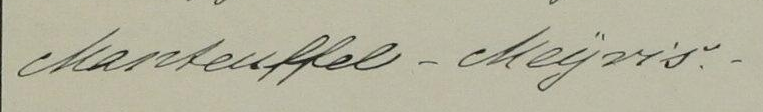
Manteuffel-Meyris.
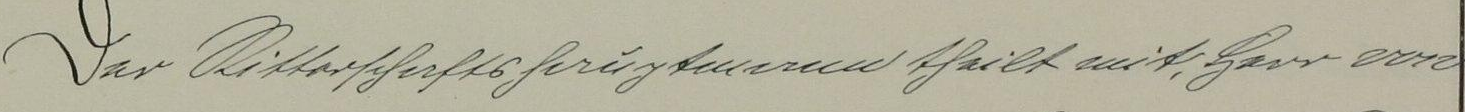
Der Ritterschaftshauptmann theilt mit, Herr von
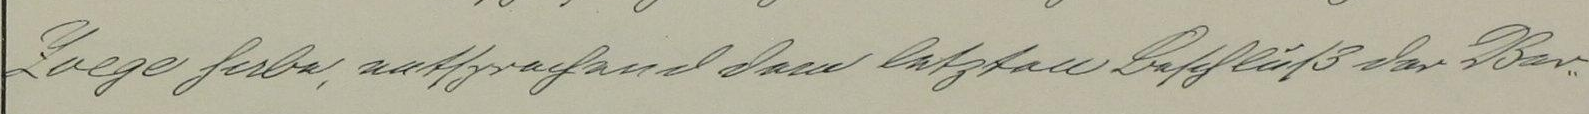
Zoege habe, entsprechend dem letzten Beschluß der Ver-
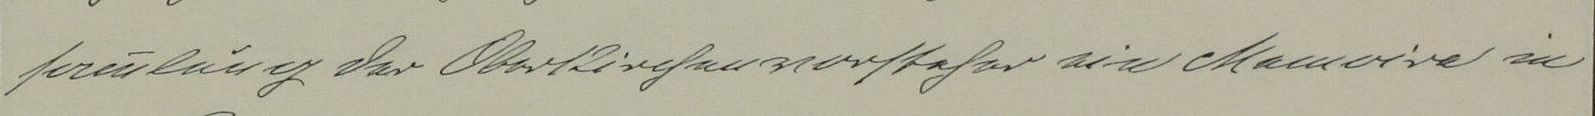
sammlung der Oberkirchenvorsteher ein Memoire in
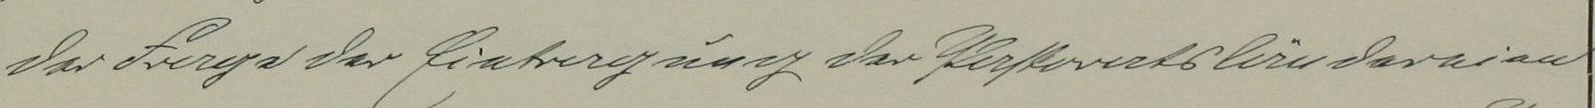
der Frage der Eintragung der Pastoratsländereien
